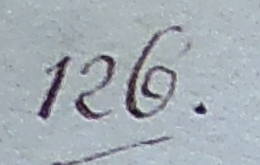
126.
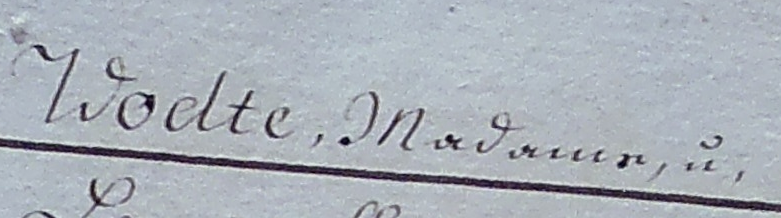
Wodte, Madame, u,
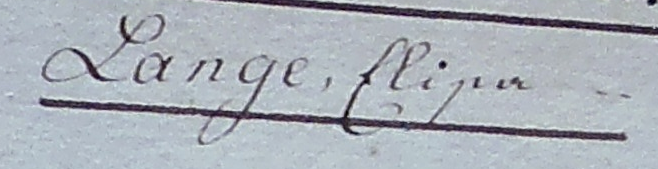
Lange, Elisa
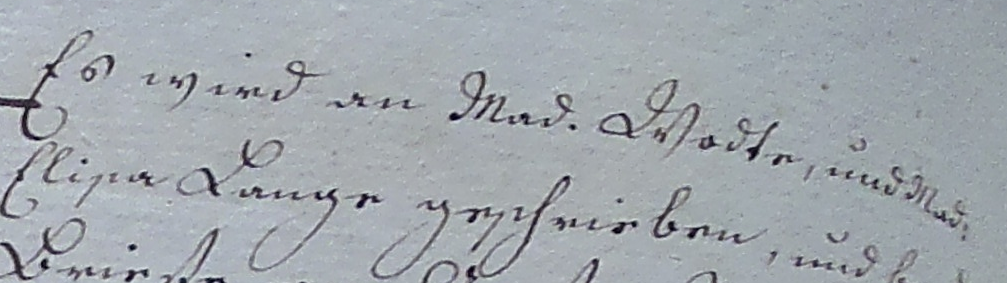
Es wird an Mad. Wodte, und Mad.
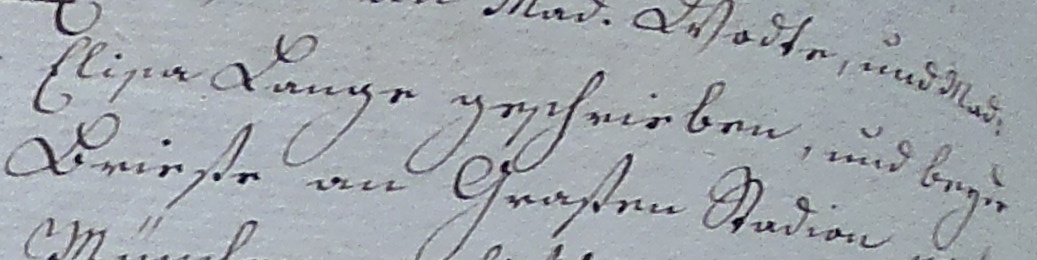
Elisa Lange geschrieben, und beyde
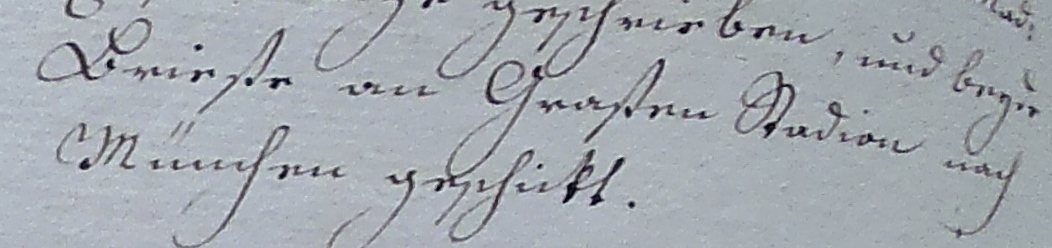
Briefe an Grafen Stadion nach
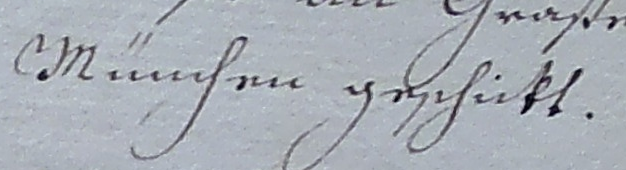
München geschickt.
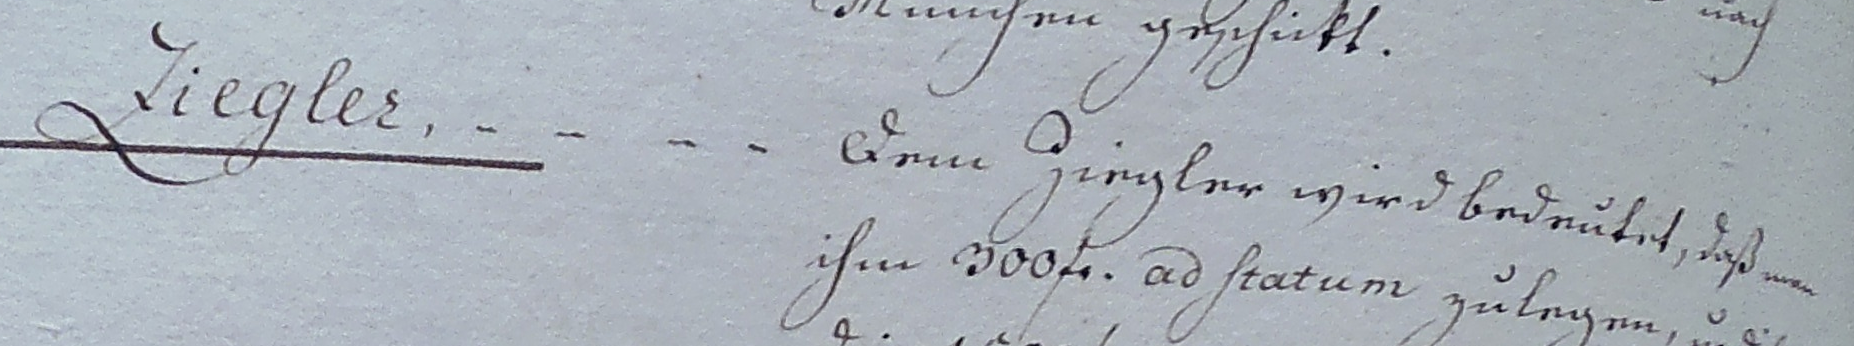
Ziegler, .. .. .. .. Dem Ziegler wird bedeutet, daß man
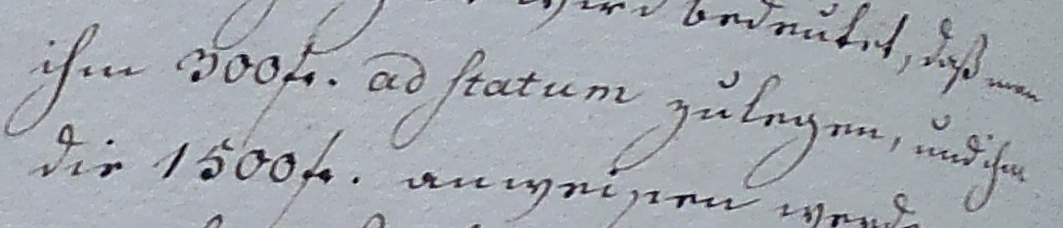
ihm 300fr. ad statum zulegen, und ihm
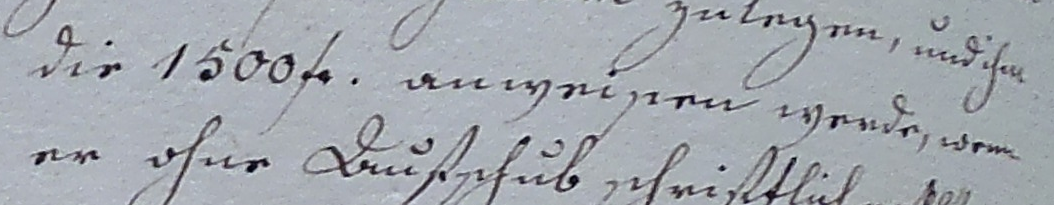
de 1500fr. anweisen werde, wenn
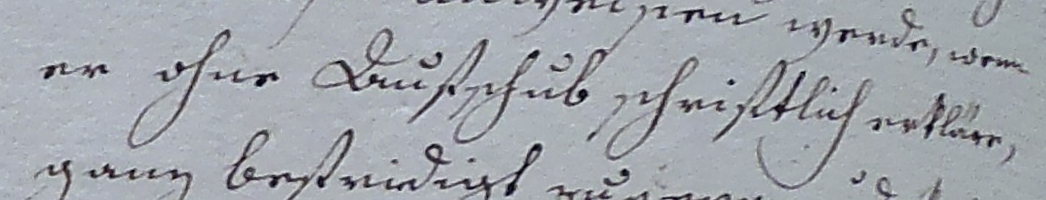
er ohne Aufschub schriftlich erkläre,
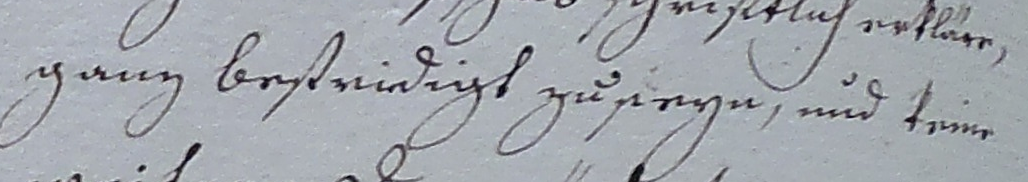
ganz befridigt zuseyn, und keine
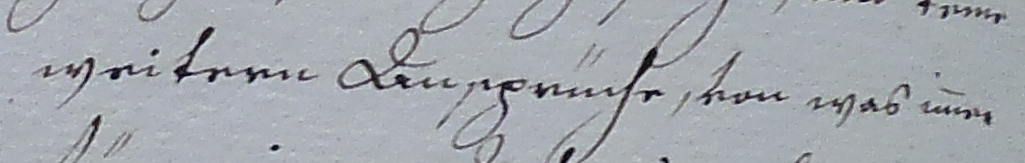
weitern Ansprüche, von was im̅er
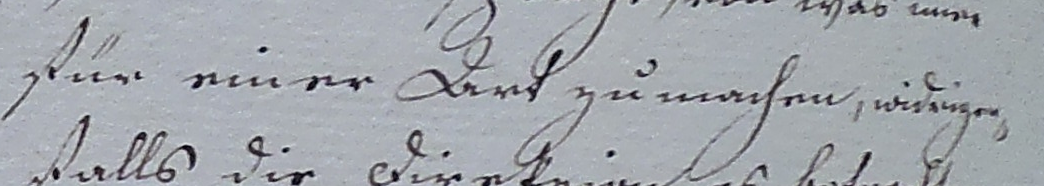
für einer Art zu machen, widrigen¬
